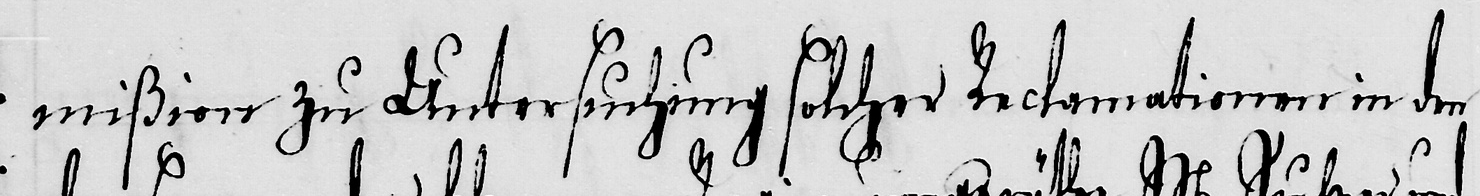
mißion zu Untersuchung solcher Reclamationen in den
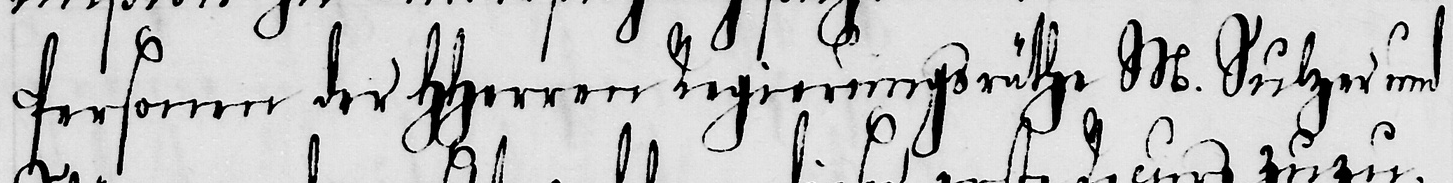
Personen der HHerren Regierungsräthe M. Sulzer und
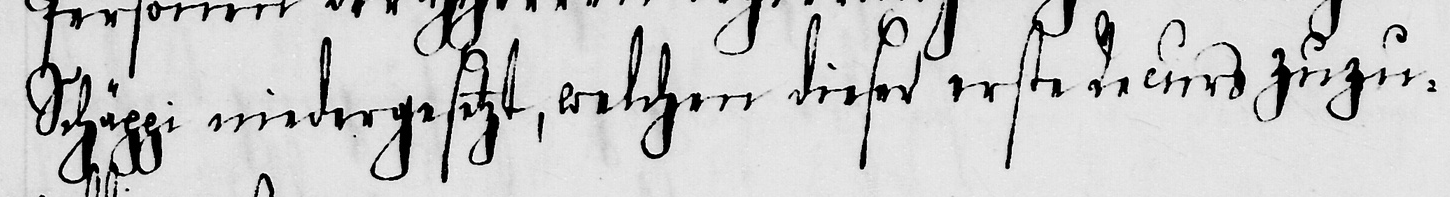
Schäppi niedergesetzt, welchen dieser erste Recurs zuzu¬
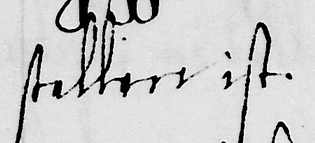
stellen ist.
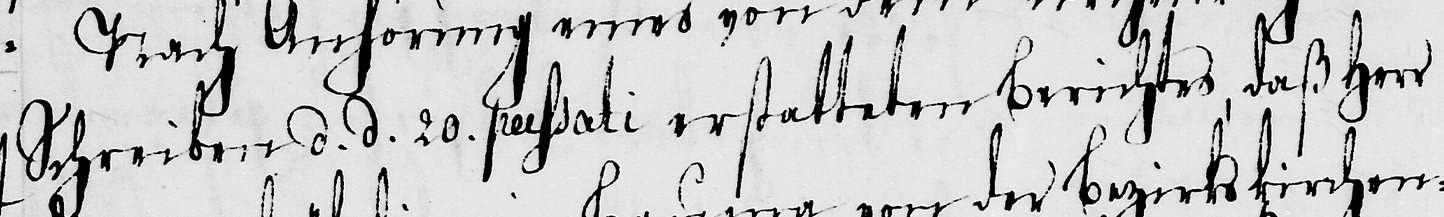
Schreiben d. d. 20. passati erstatteten Berichtes, daß Herr
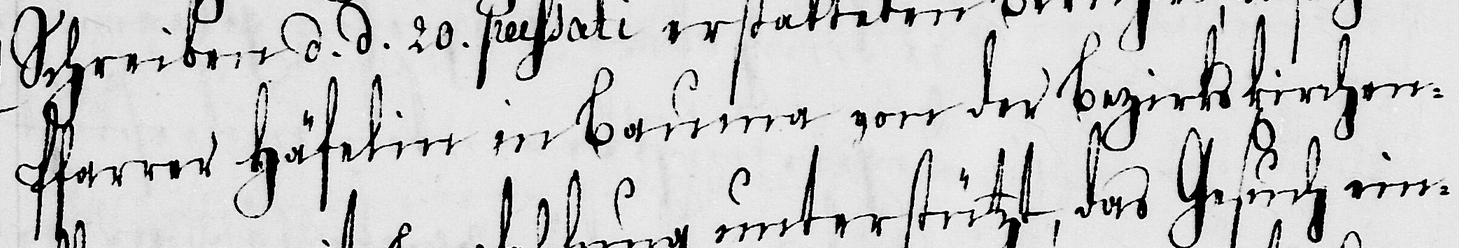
Pfarrer Häfelin in Bauma von der Bezirkskirchen¬
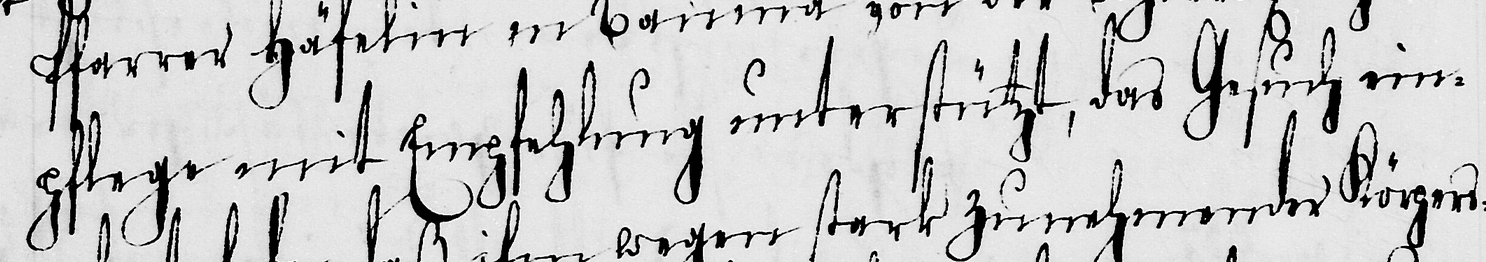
pflege mit Empfehlung unterstützt, das Gesuch ein¬
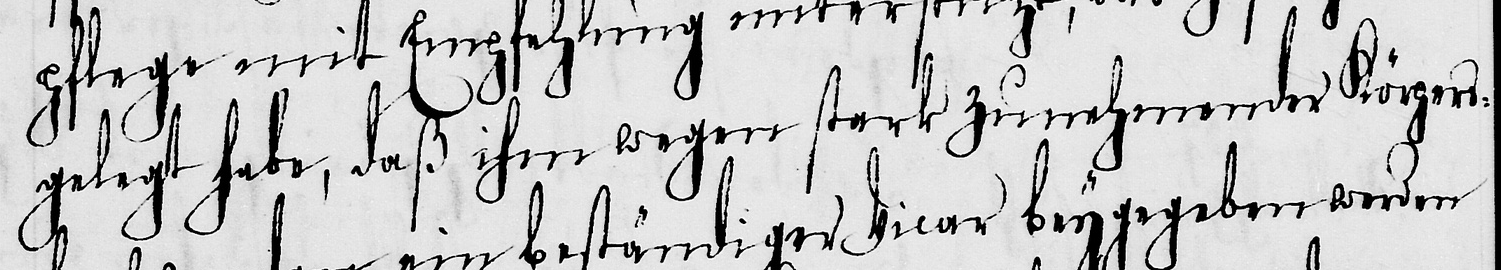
gelegt habe, daß ihm wegen stark zunehmender Körpe¬
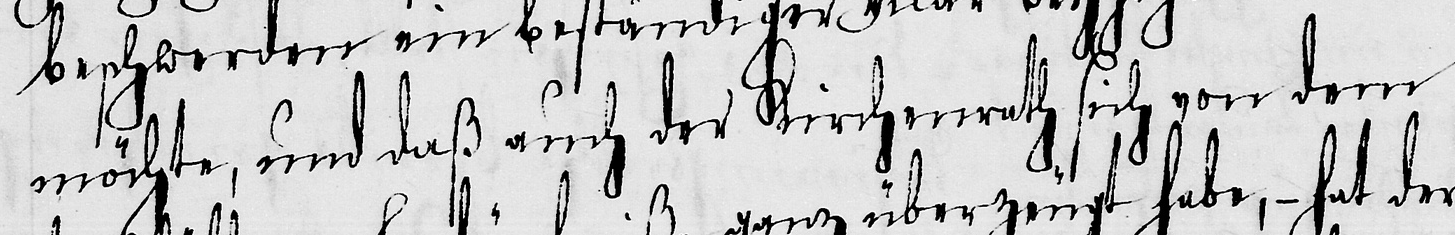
möchte, und daß auch der Kirchenrath sich von dem
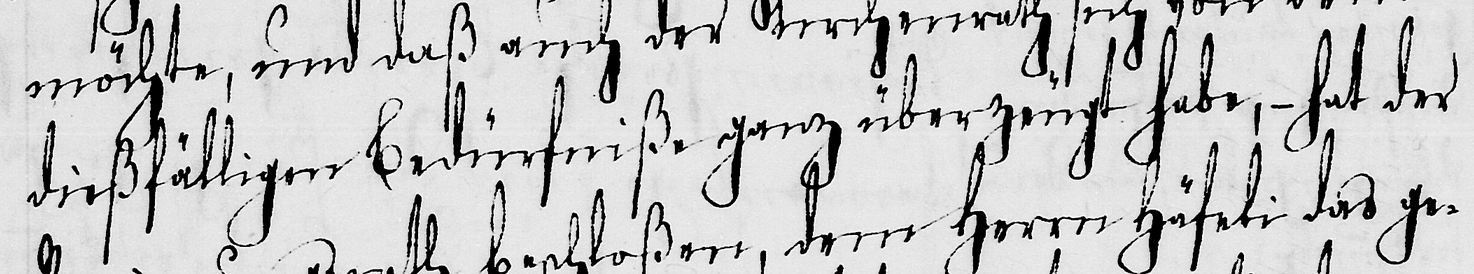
dießfälligen Bedürfniße ganz überzeugt habe, – hat der
